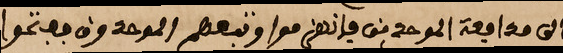الى مدافعة الموحدين فانهزموا وتبعهم الموحدون ففتحوا
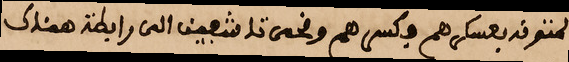لمتونه بعسكرهم يكسرهم ونحى تاشفين الى رابطة هناك
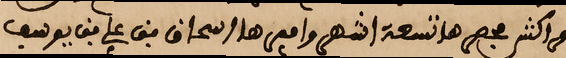مراكش فحصرها تسعة اشهر واميرها إسحاق بن علي بن يوسف
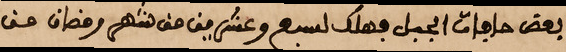بعض حافات الجبل فهلك لسبع وعشرين من شهر رمضان من
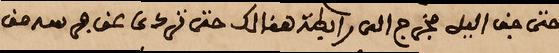حتى جن اليل فخرج الى رابطة هنالك حتى تردى عن فرسه من
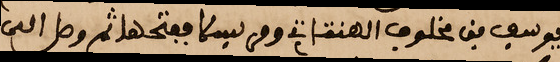يوسف بن مخلوف الهنتاتي ومر بسلا ففتحها ثم وصل الى
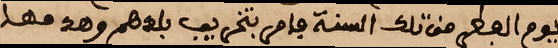يوم الفطر من تلك السنة فامر بتخريب بلدهم وهدمها
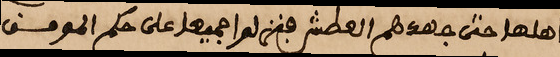اهلها حتى جهدهم العطش فنزلوا جميعا على حكم المومن
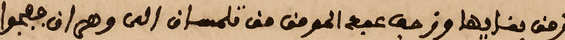زمن بنايها وزحف عبد المومن من تلمسان الى وهران ففجوا
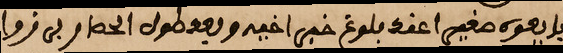بايعوه صغيرا عند بلوغ خبر اخيه وبعد طول الحصار برزوا
